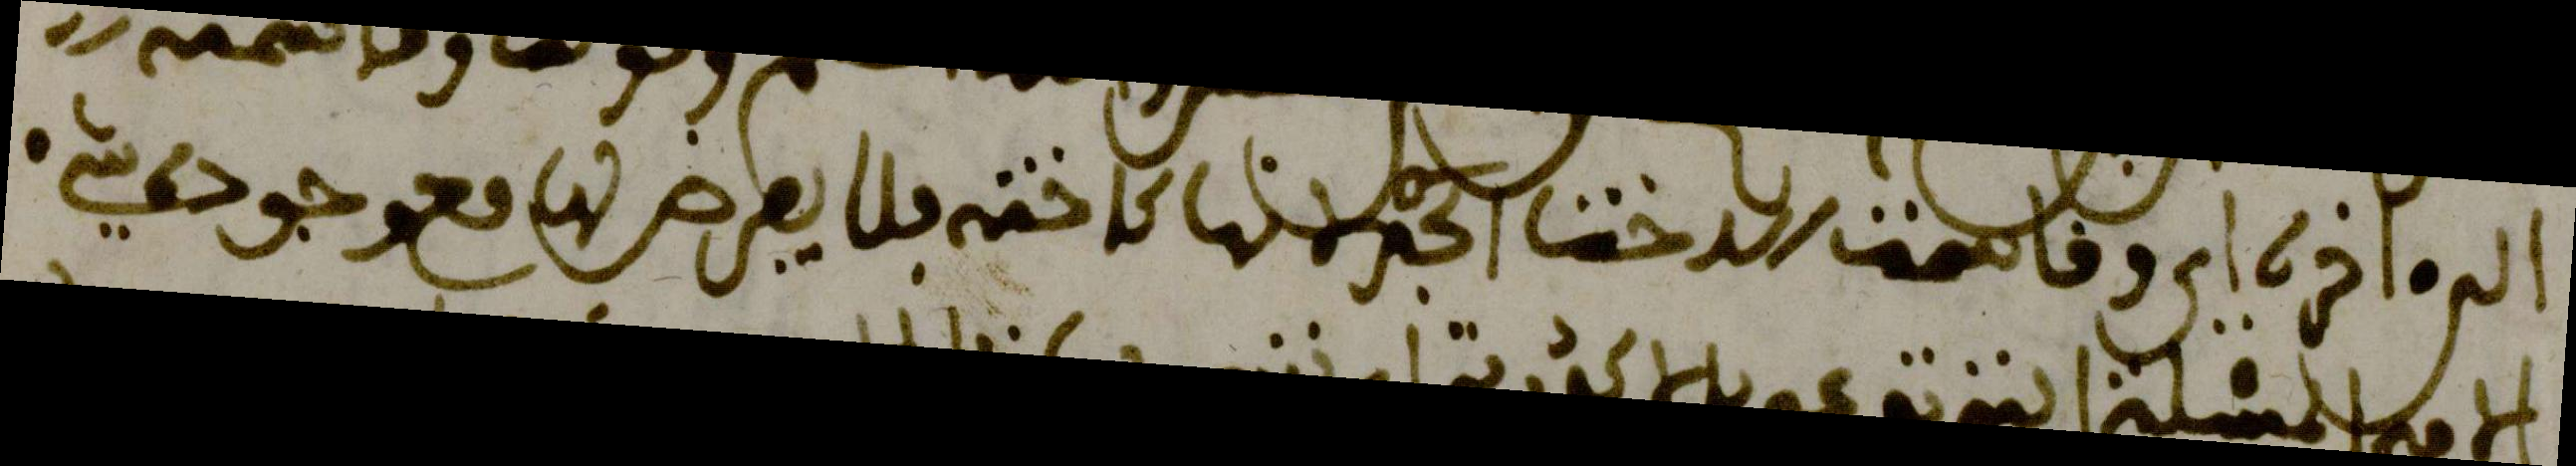الى ءاخره اي وقاسمت الاخت الجد لانها كاخته فلا يفرض لها مه وجوده شيء
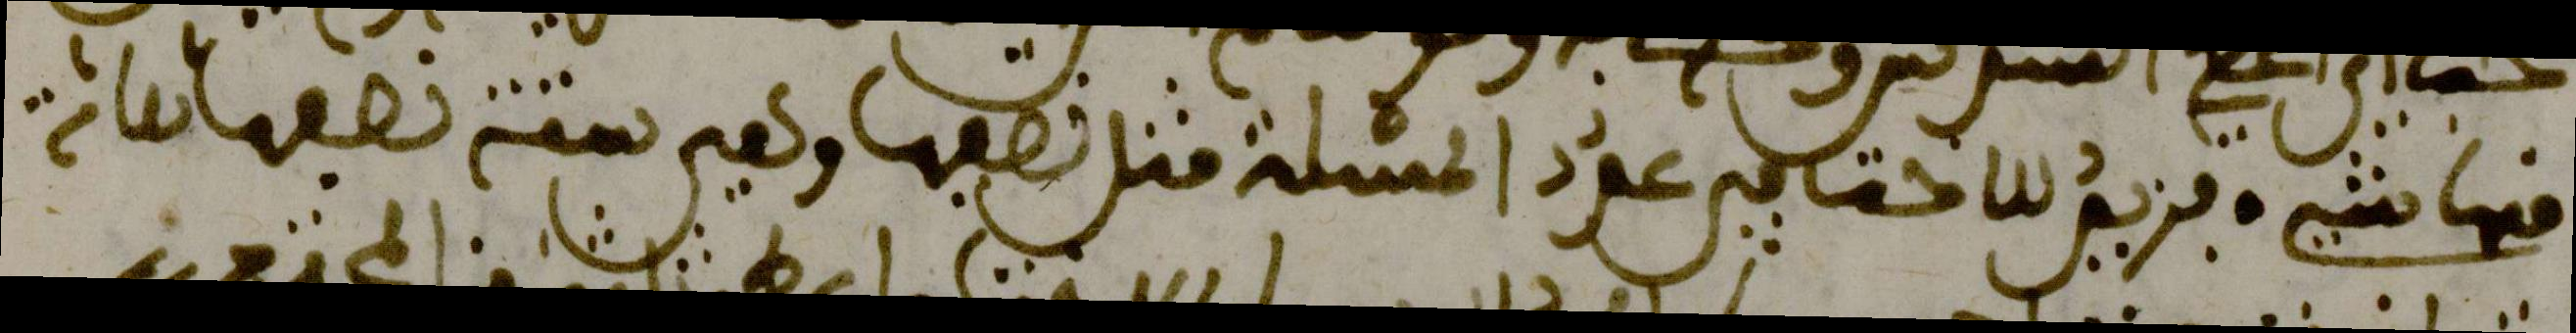منها شيء فزيد للاخت في عدد المسْلة مثل نصفها ووهي ستة نصفها ثلاثة
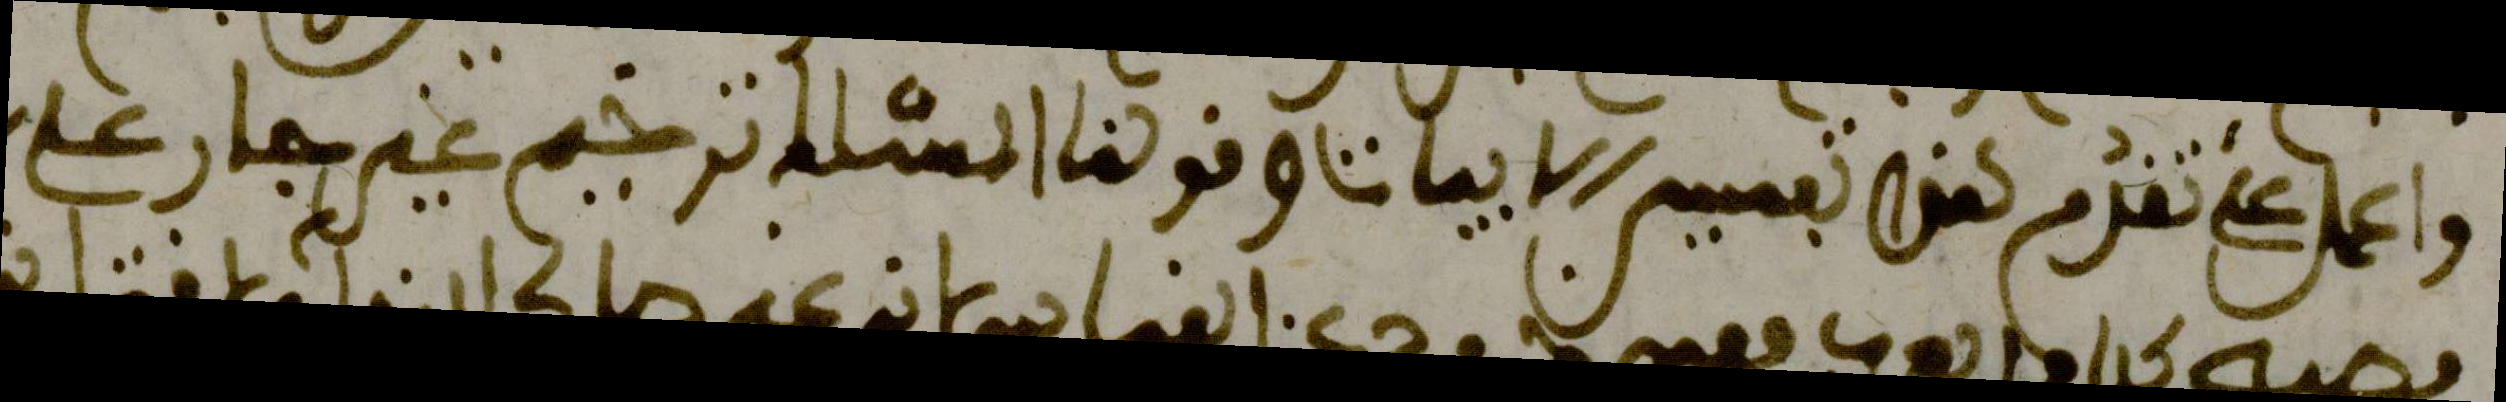واعمل على تقدم هذا تفسير الابيات وقولنا المسْلا ترخيم غير جار على
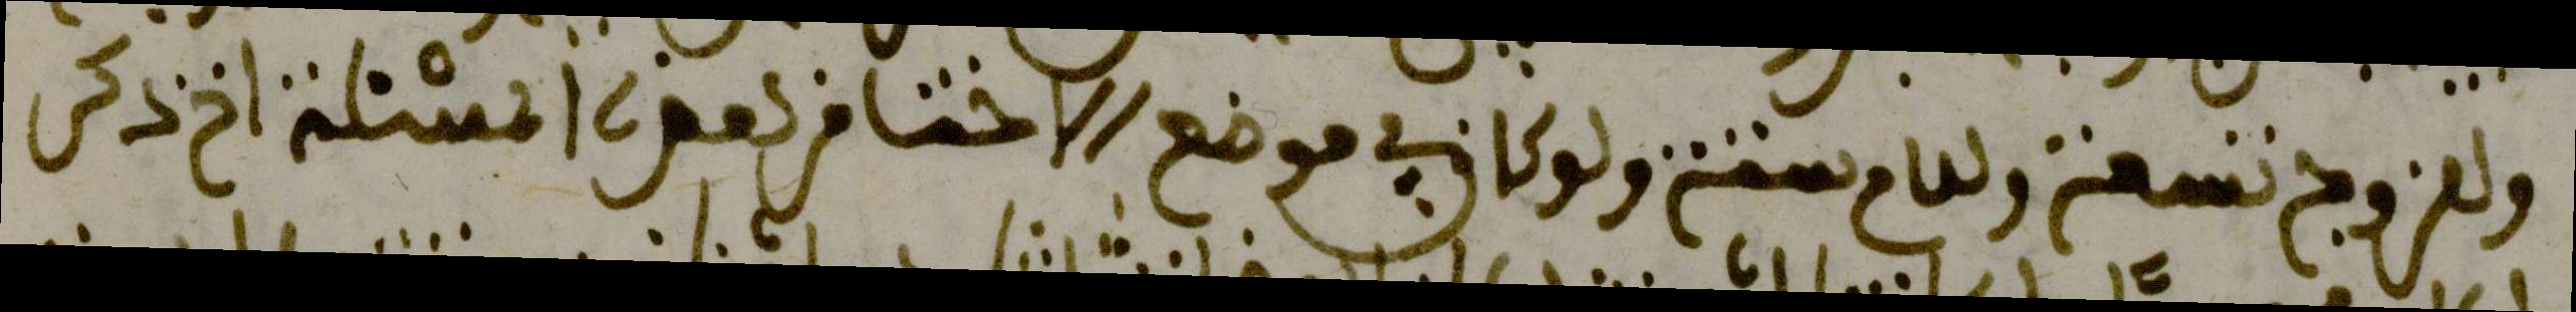وللزوج تسعة وللام ستة ولو كان في موضع الاخت من هذه المسْئلة اخ ذكر
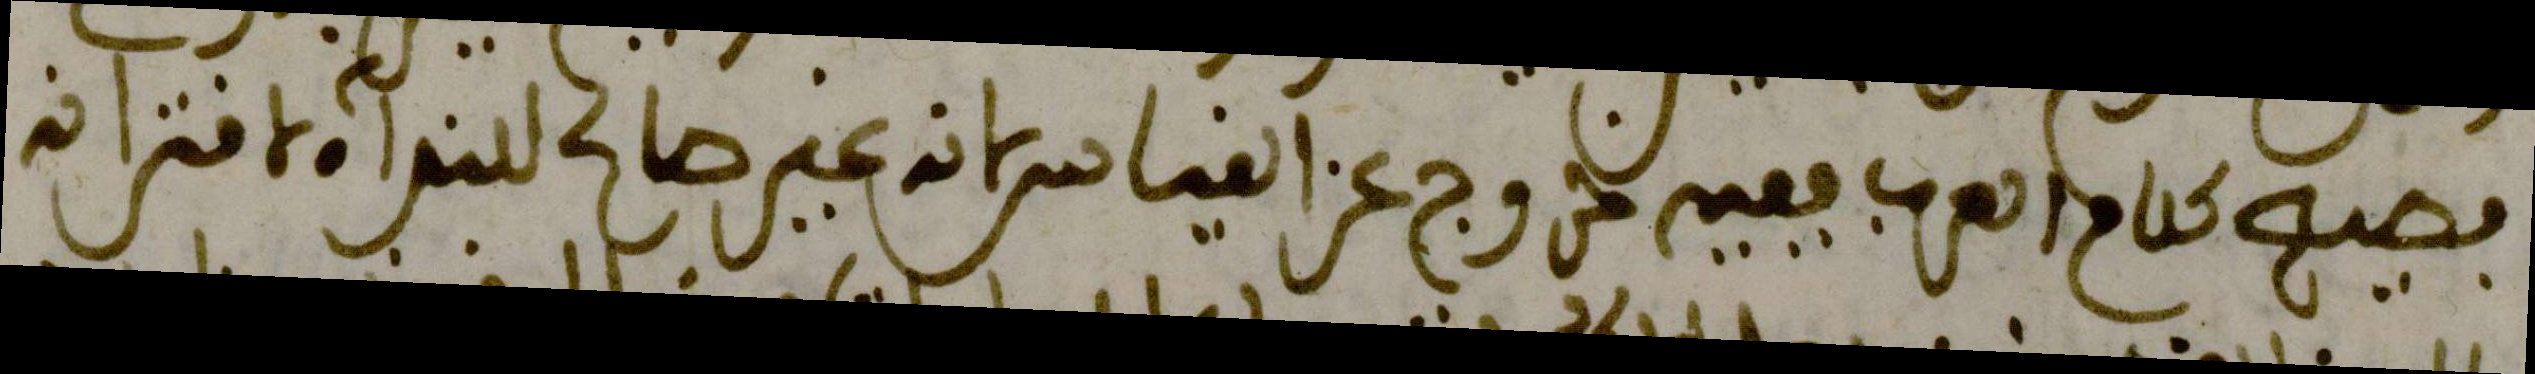فصيح كلام العرب ففيه خروج عن القياس لانه غير صالح للنداء لافترنه
